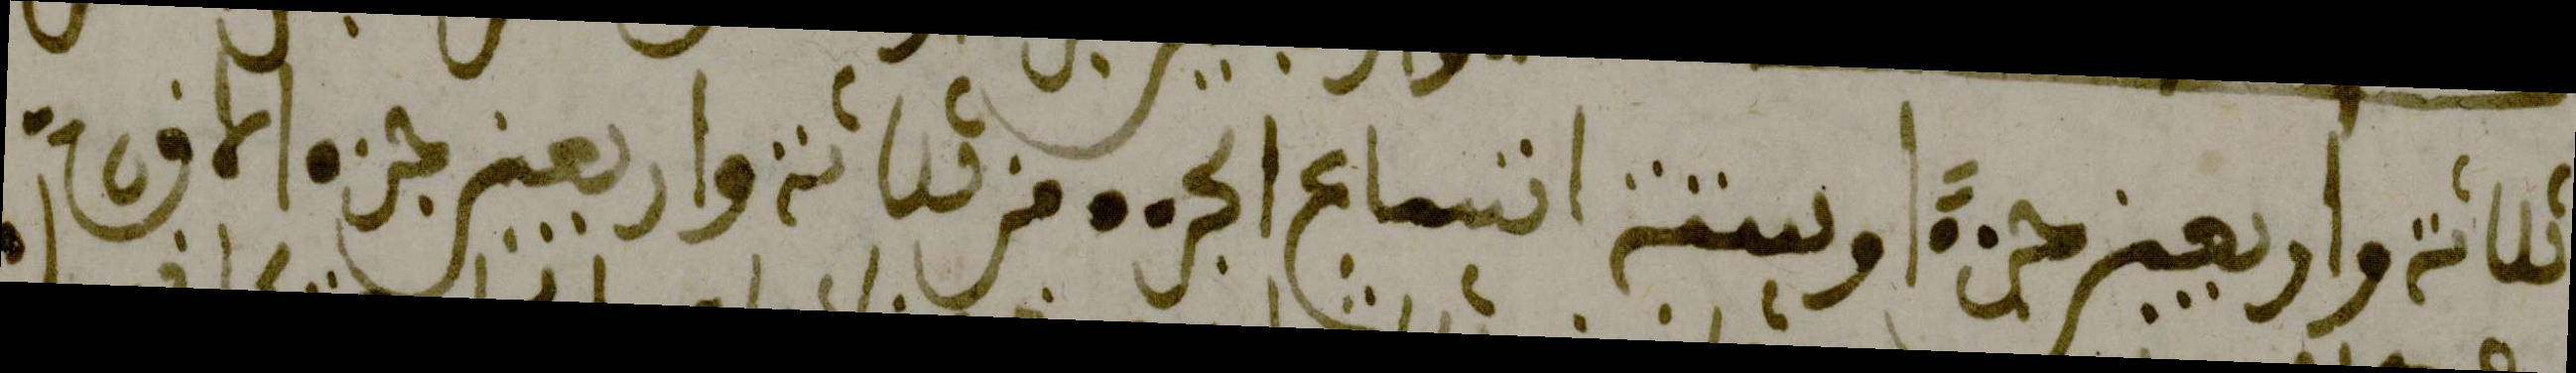ثلاثة واربعين جزءًا وستة اتساع الجزء من ثلاثة واربعين حزءا لان
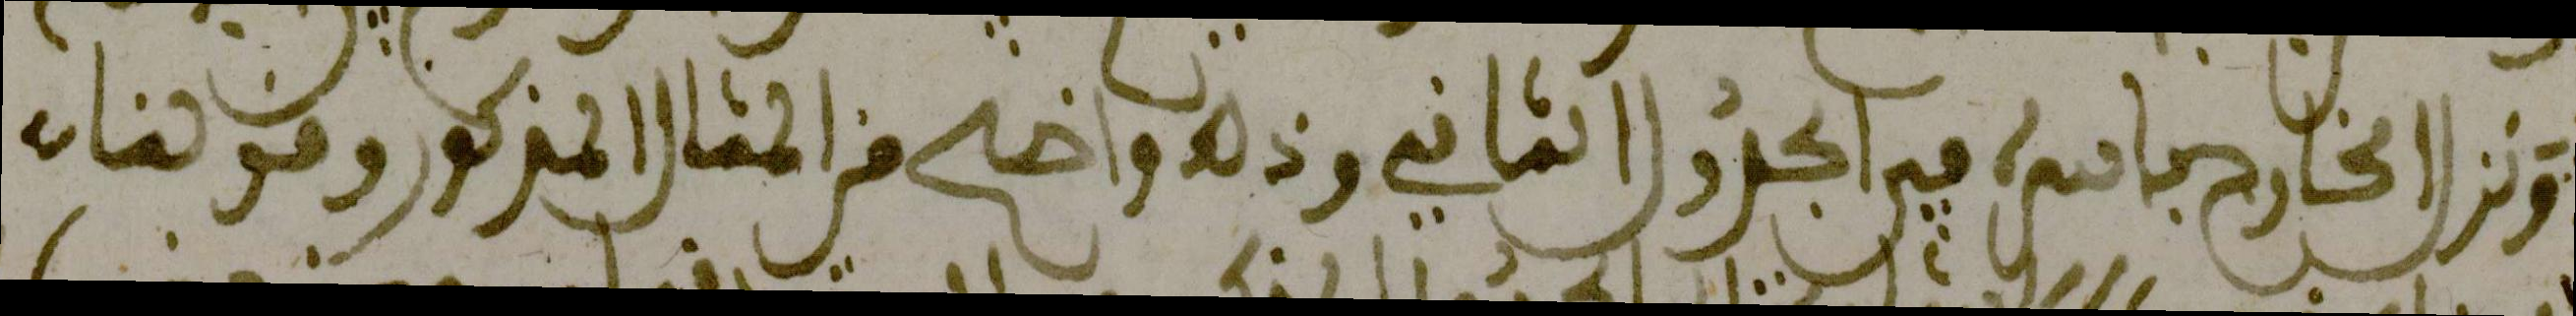وَنزل الخارج باسره في الجدول الثاني وذلك واضح من المثال المذكور وقولنا
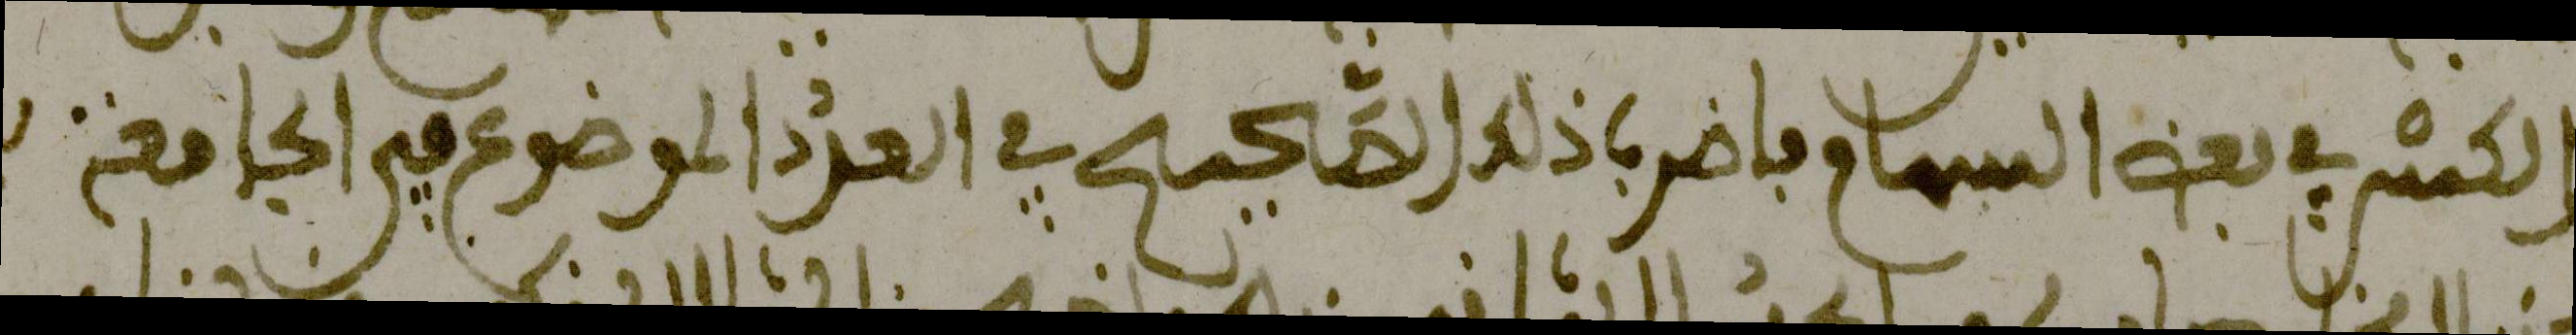الكسْر في بعض السهام فاضرب ذلك الصَّحيح في العدد الموضوع في الجامعة
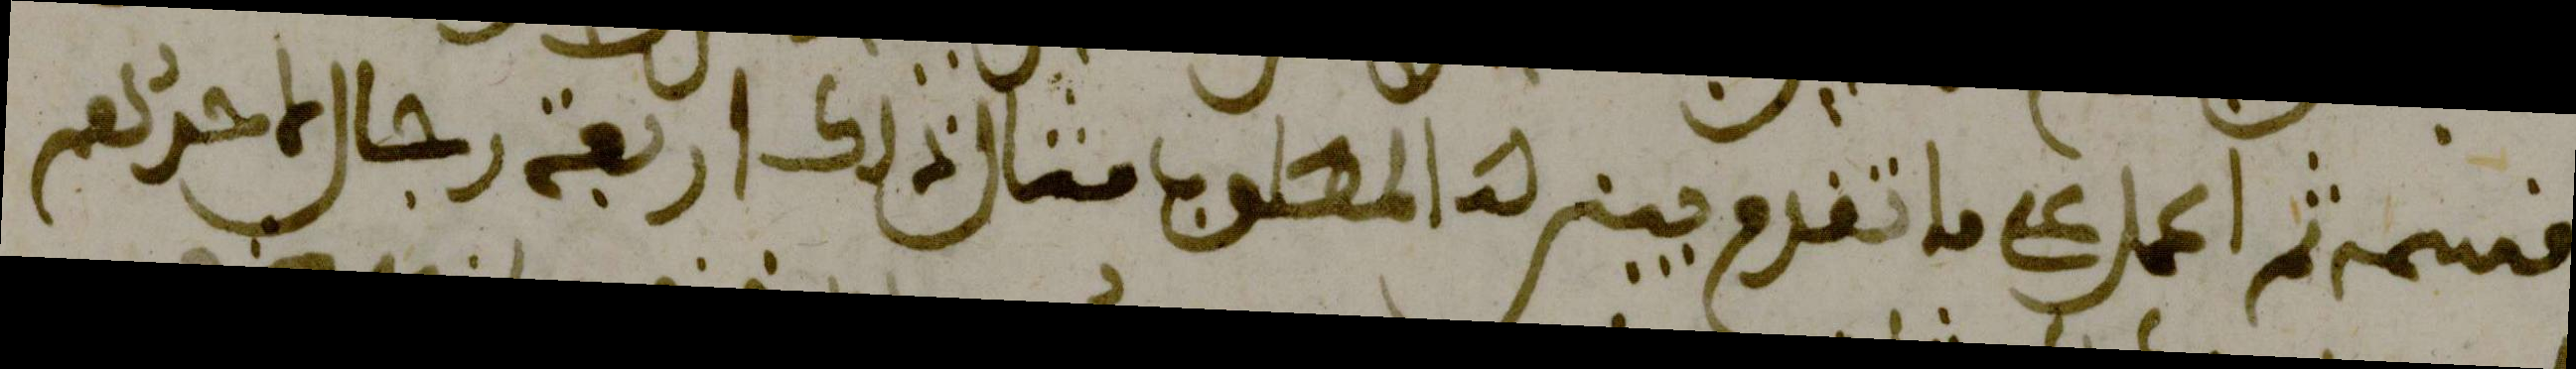قسمه ثم اعمل على ما تقدم بين لك المطلوب مثال ذلك اربعة رجال لاحدهم
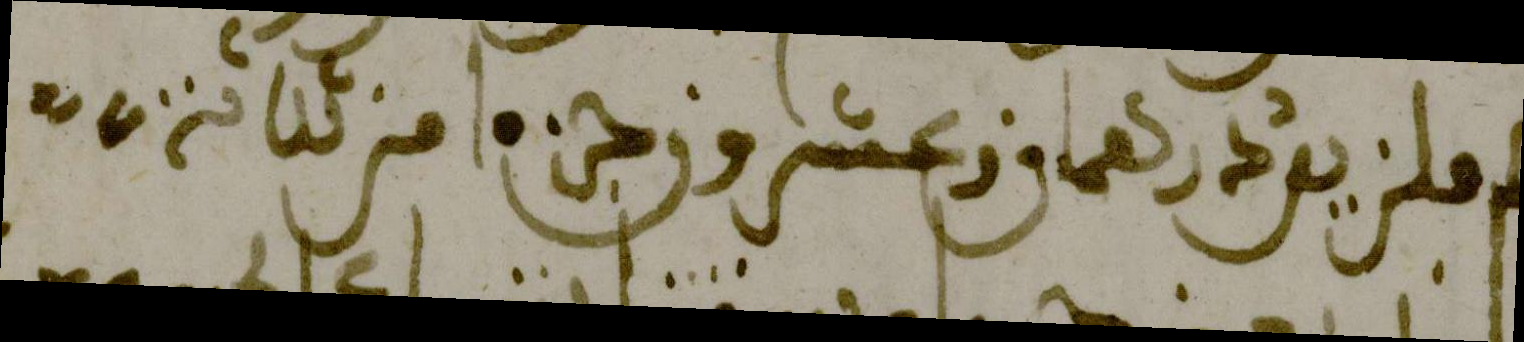فلزيد درهمان وعشرون جزء من ثلاثة
